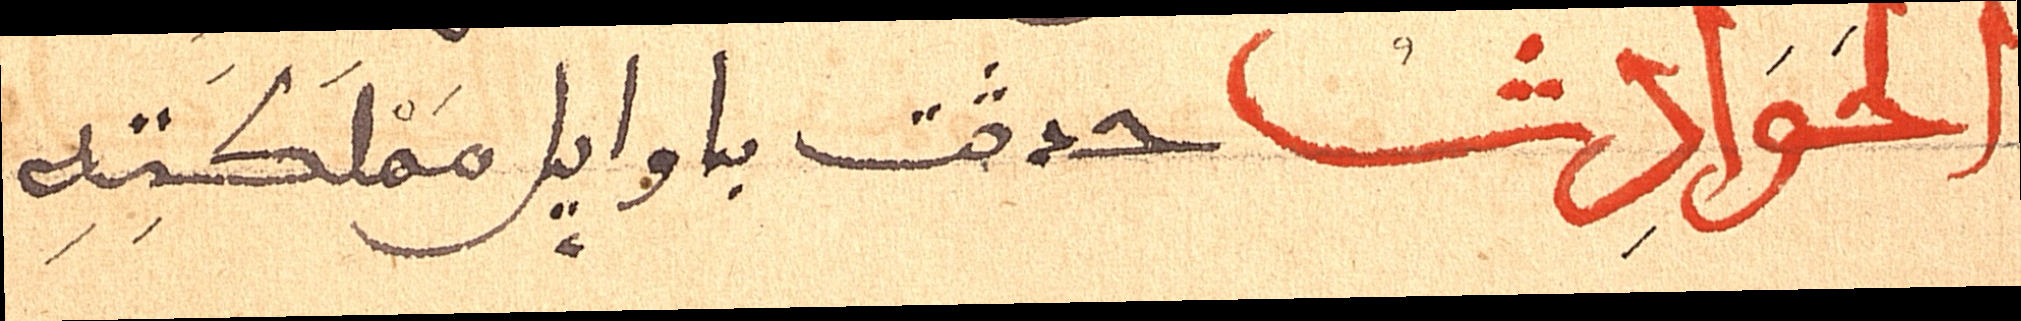الحوادث حدثت باوائل مملكته
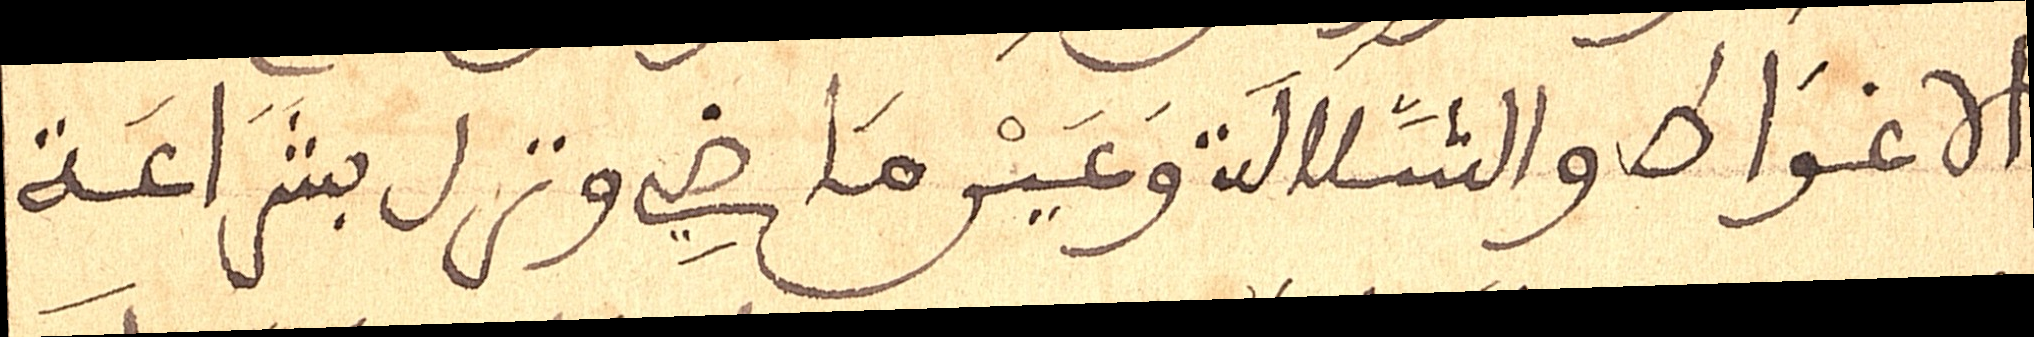الاغواط والشلالة وعير ماضي ونزل بشراعة
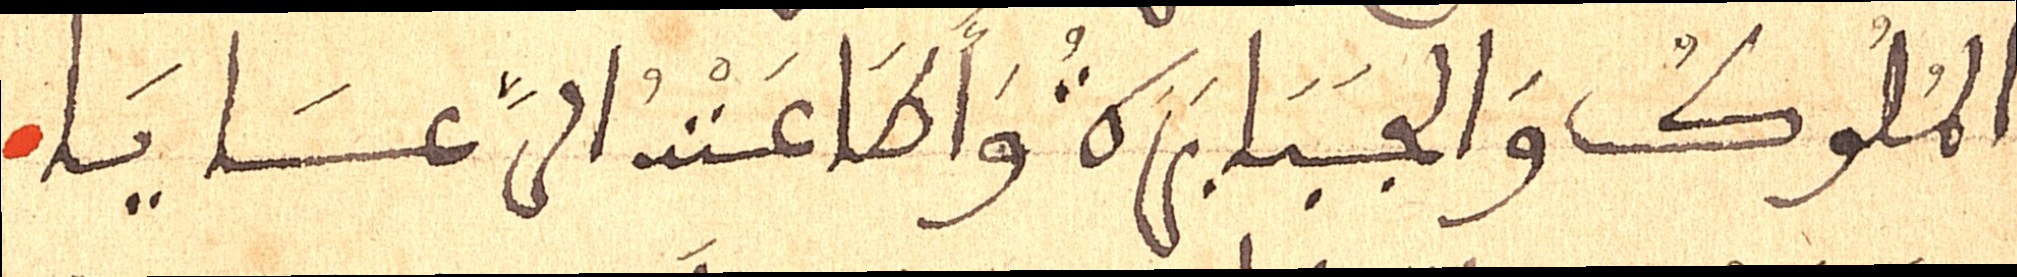الملوك والجبابرة واطاعته الى عايا
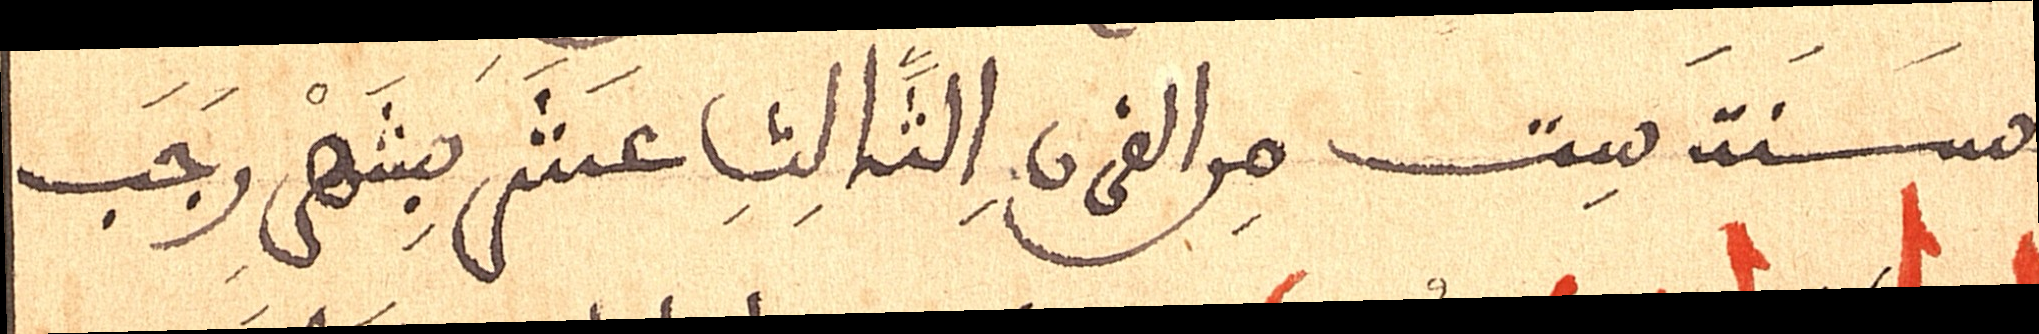سنت ست من القرن الثالث عشر بسهر رجب
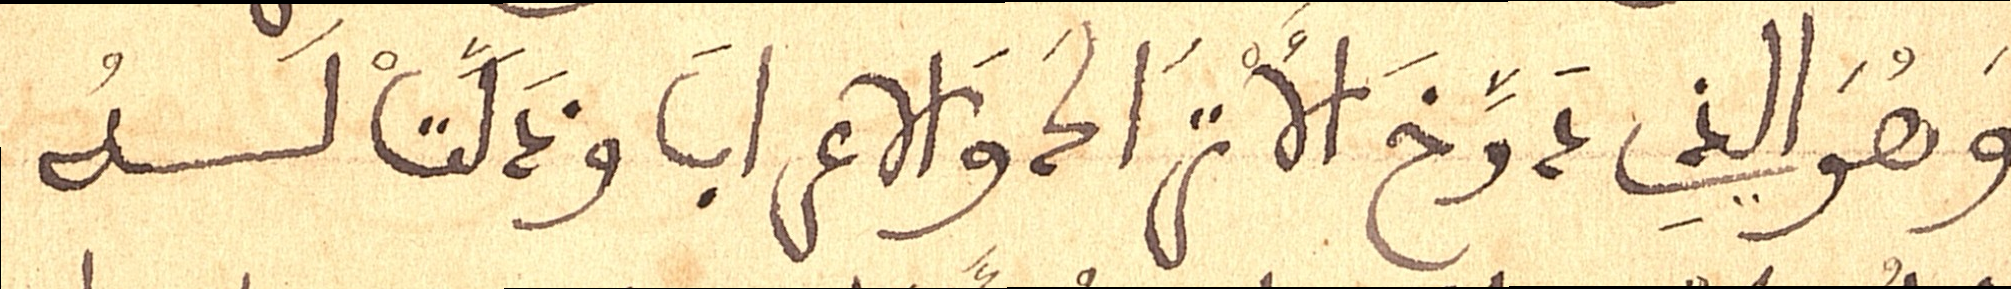وهو الذي دوخ الاتراك والاعراب وذلك له
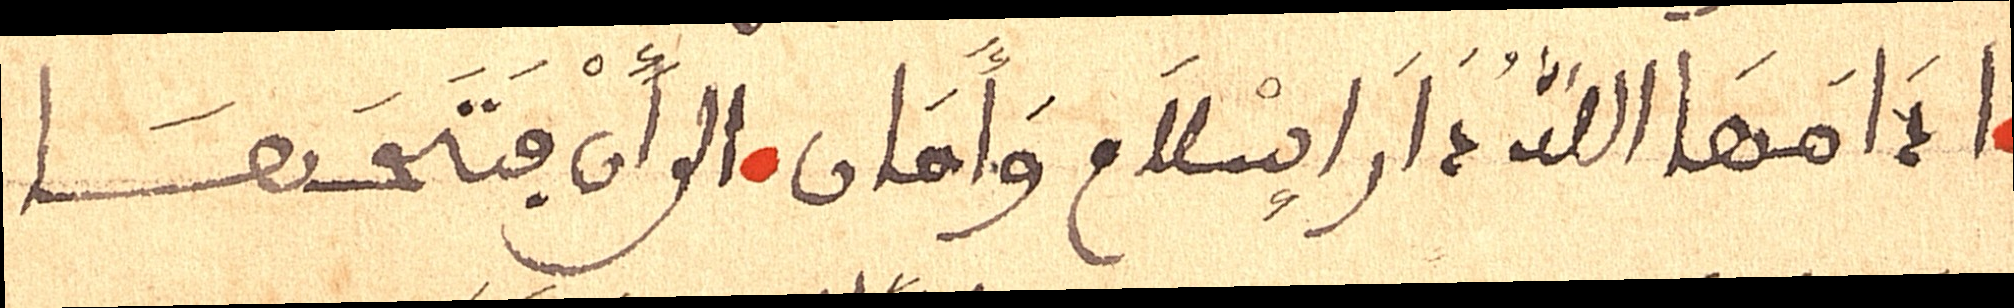ادا مما الله دار اسلام وامان الى ان فتحها
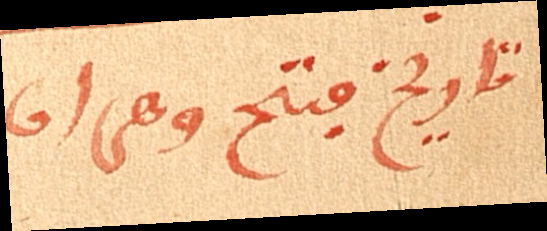تاريخ فتح وهران
